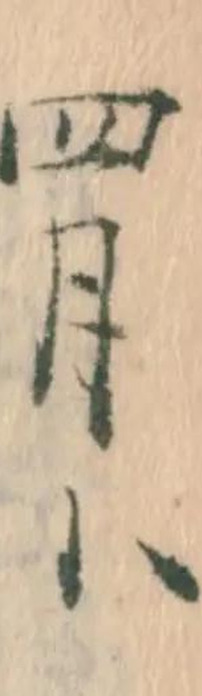四月小
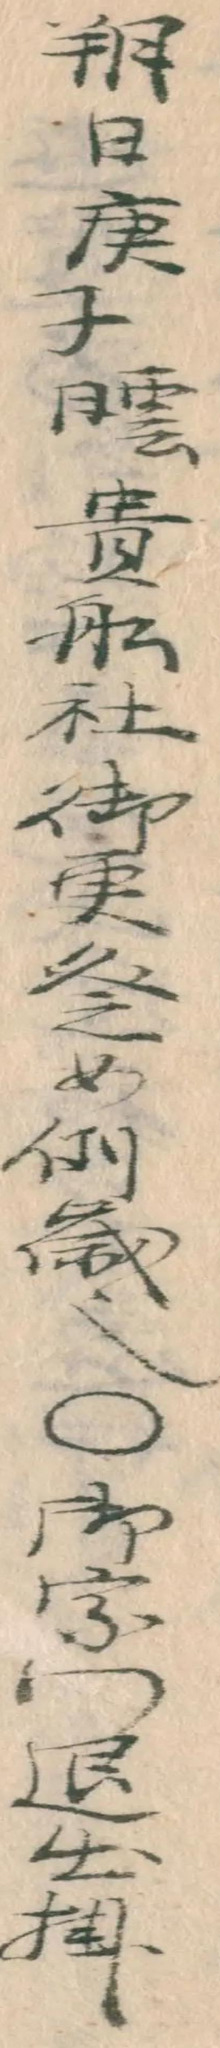朔日庚子曇貴船社御更祭如例歳也○御家門退出掛
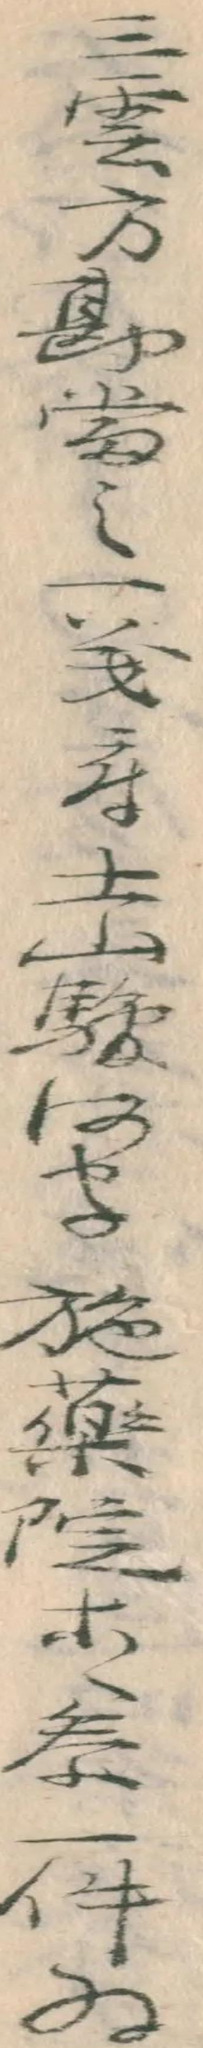三雲方勘当之一義ニ付土山駿河守施薬院等へ参一件為
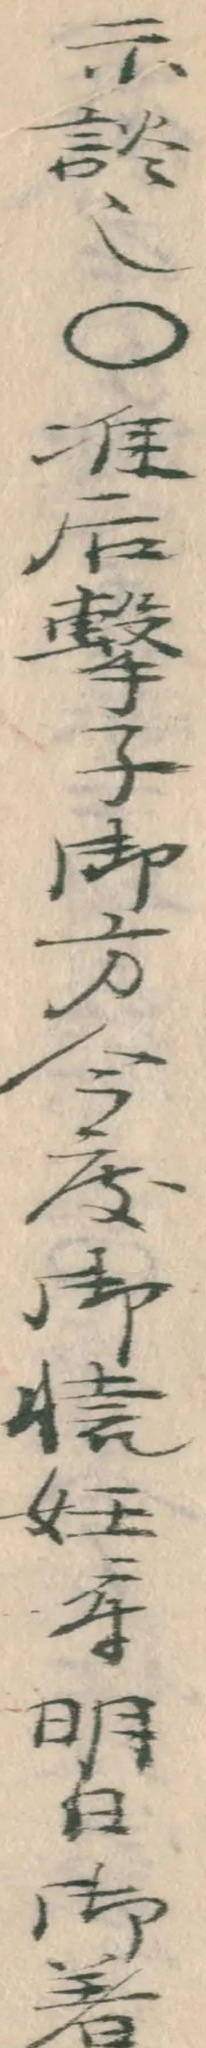示談也○准后撃子御方今度御懐妊ニ付明日御着
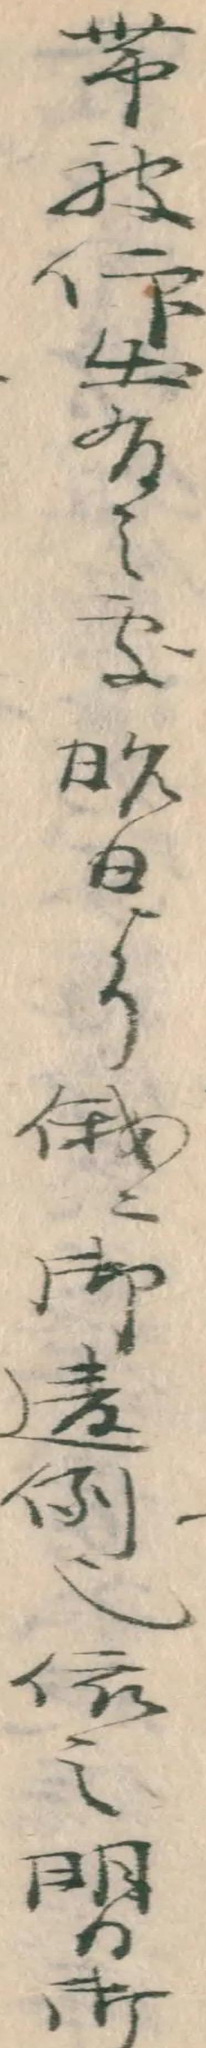帯被仰出有之処昨日より俄ニ御違例也依之明日御
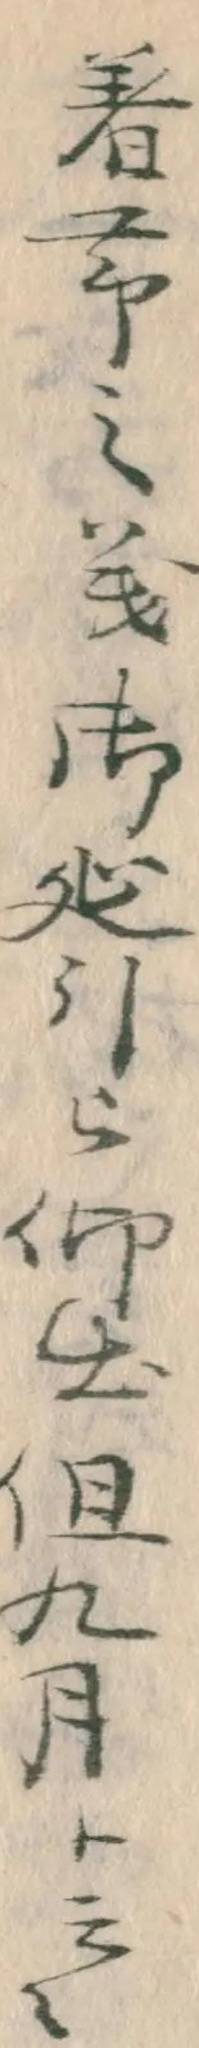着帯之義御延引被仰出但九月ト云々
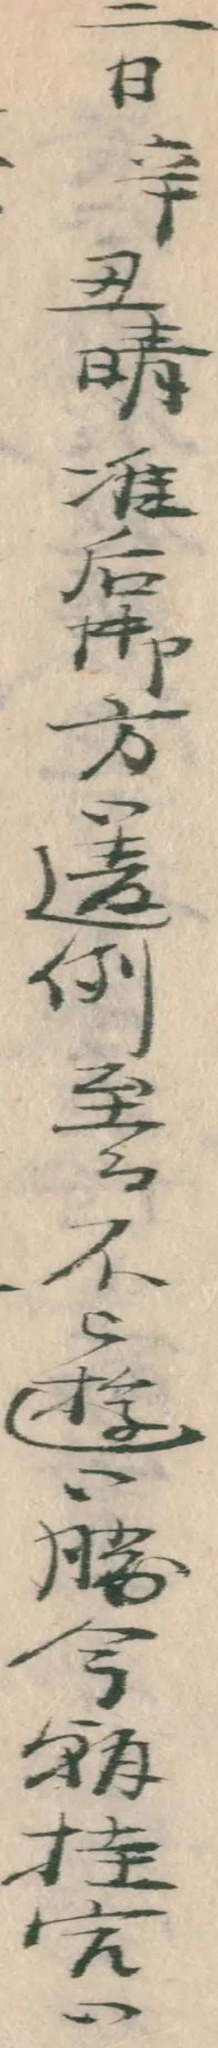二日辛丑晴准后御方御違例至而不被遊御勝今朝桂宮御
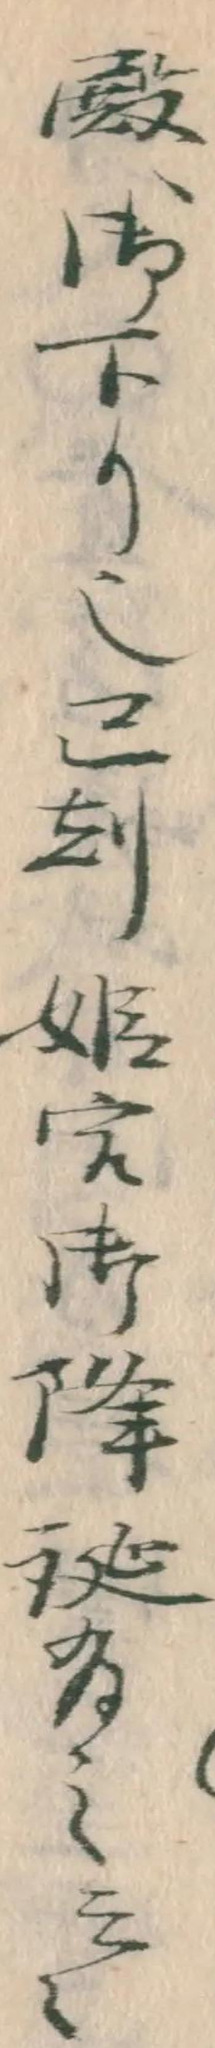殿へ御下り也巳刻姫宮御降誕云々
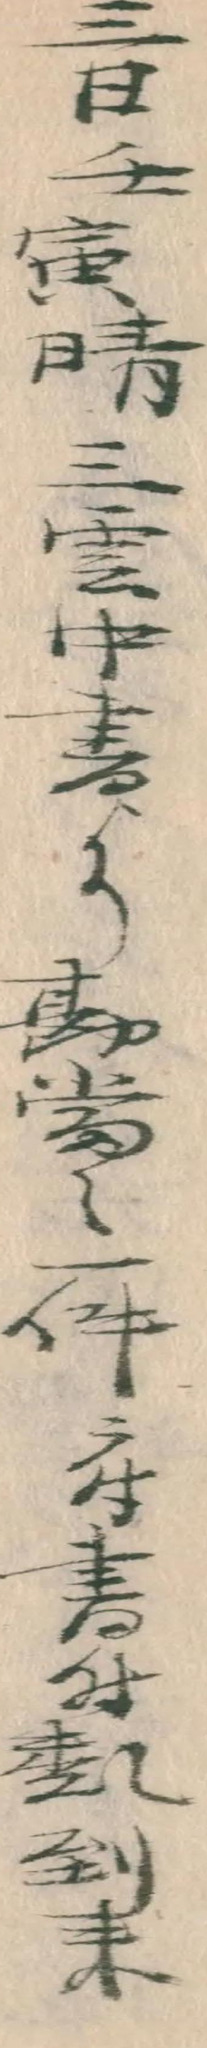三日壬寅晴三雲中書より勘当之一件ニ付書付類到来
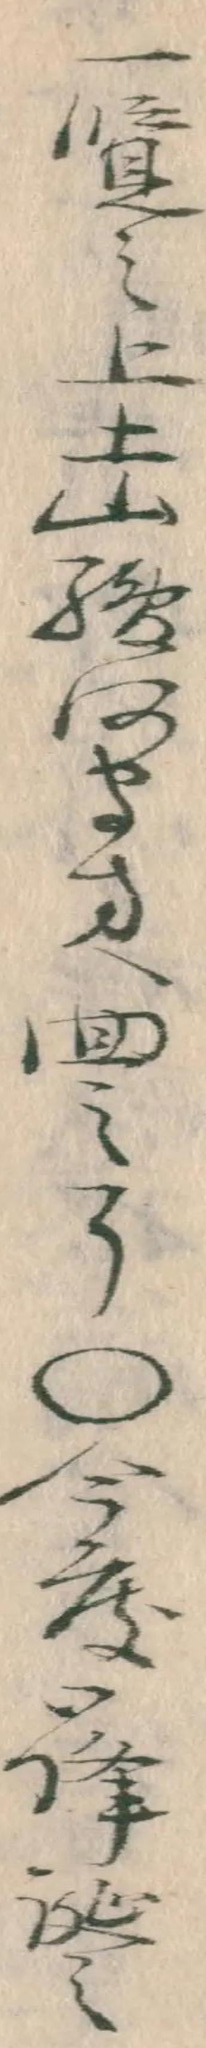一覧之上土山駿河守方へ回之了○今度御降誕之
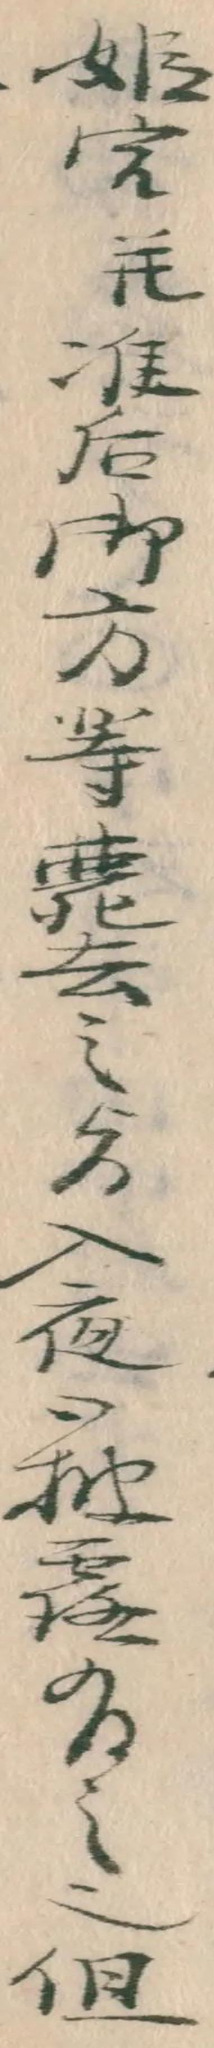姫宮幷准后御方等薨去之旨入夜御披露有之也但
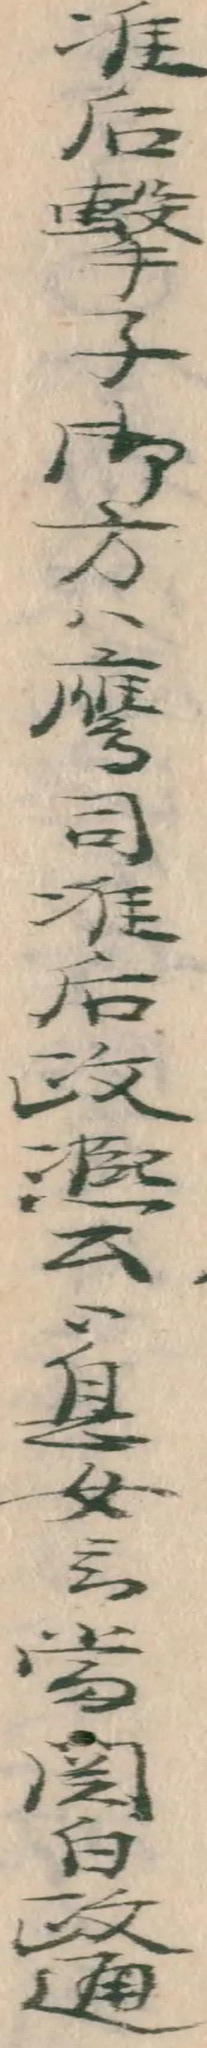准后撃子御方ハ鷹司准后政煕公御息女ニ而当関白政通
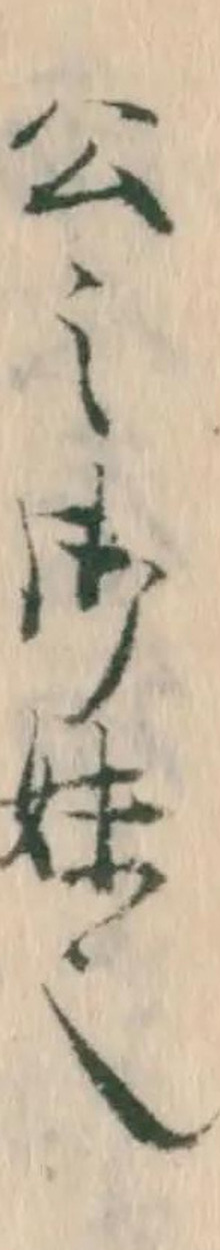公之御妹也
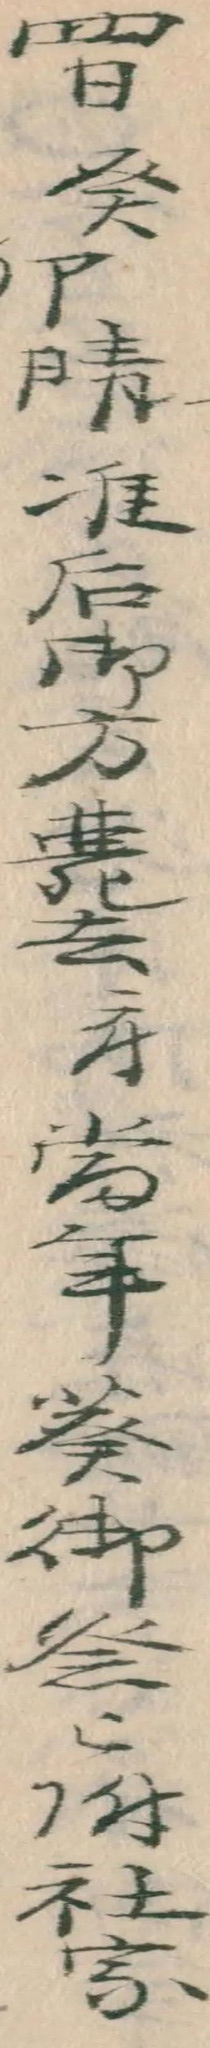四日癸卯晴准后御方薨御ニ付当年葵御祭被附社家
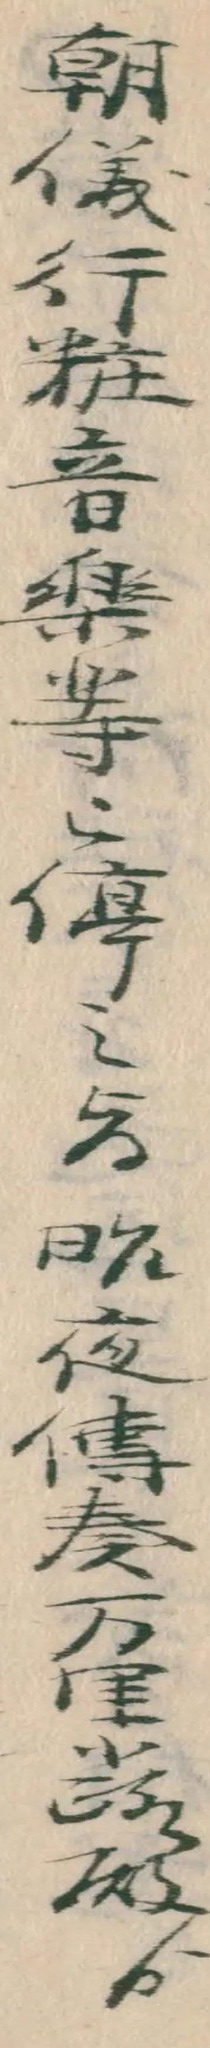朝儀行粧音楽等被停之旨昨夜伝奏万里小路殿ゟ
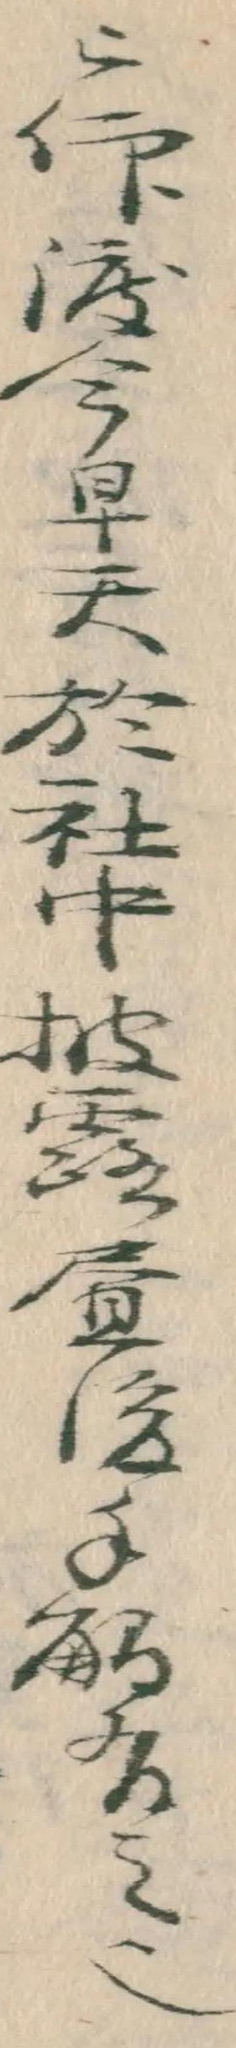被仰渡今早天於社中披露昼後手触有之也
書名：賀茂社記録. 第64冊
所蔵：国立国会図書館 National Diet Library, JAPAN
